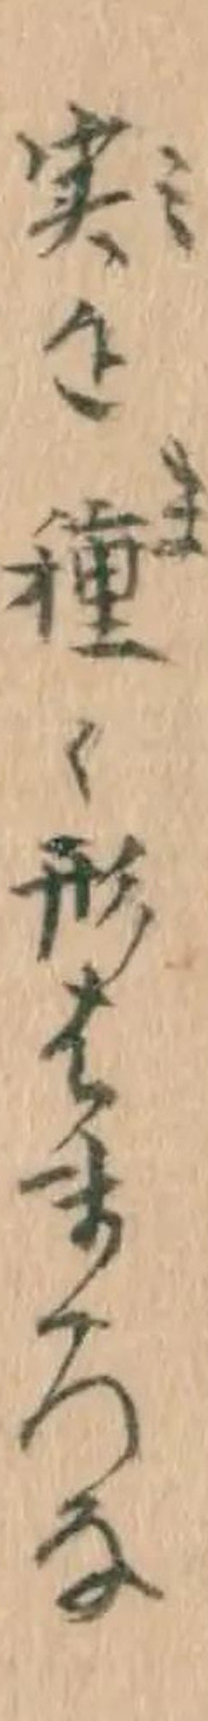実を種く形はまゝつな
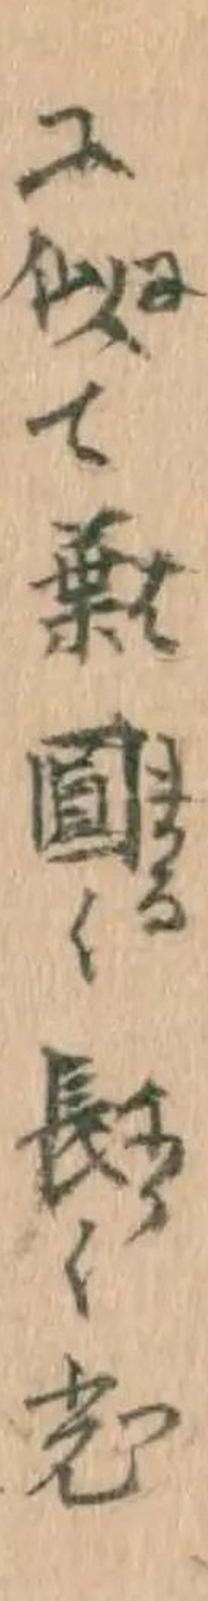に似て葉円く長く光
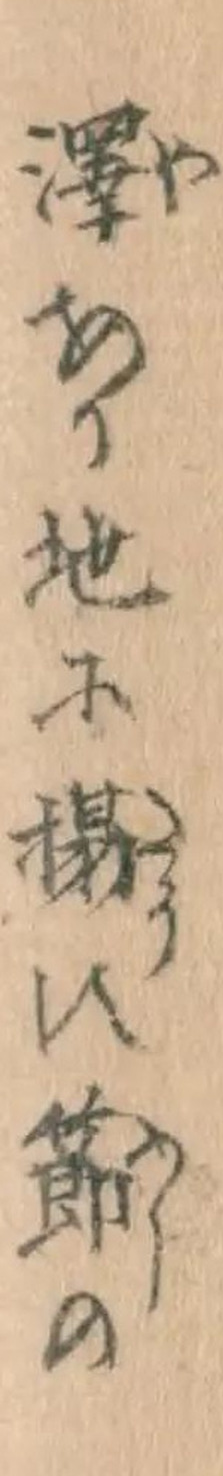沢あり地に搨す節の
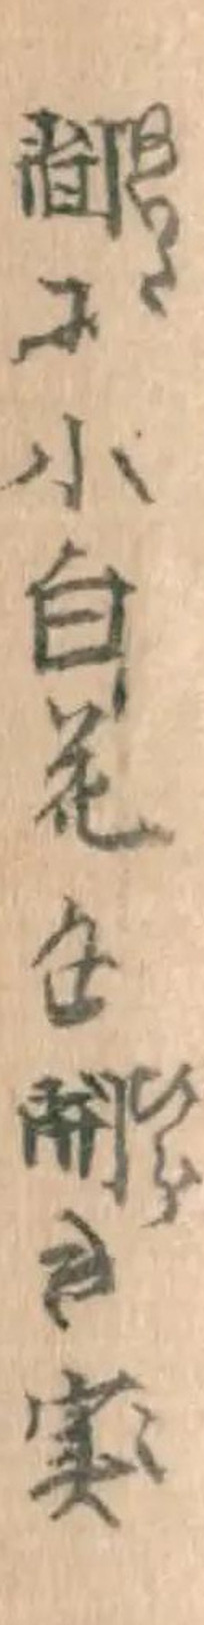間に小白花を開き実
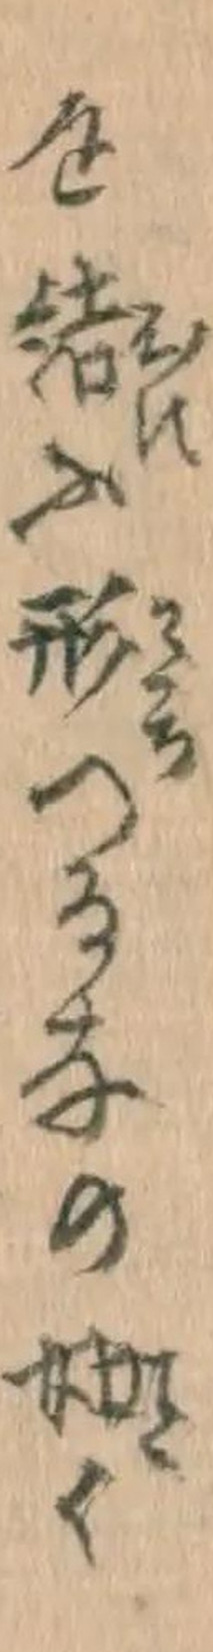を結ふ形つるなの如く
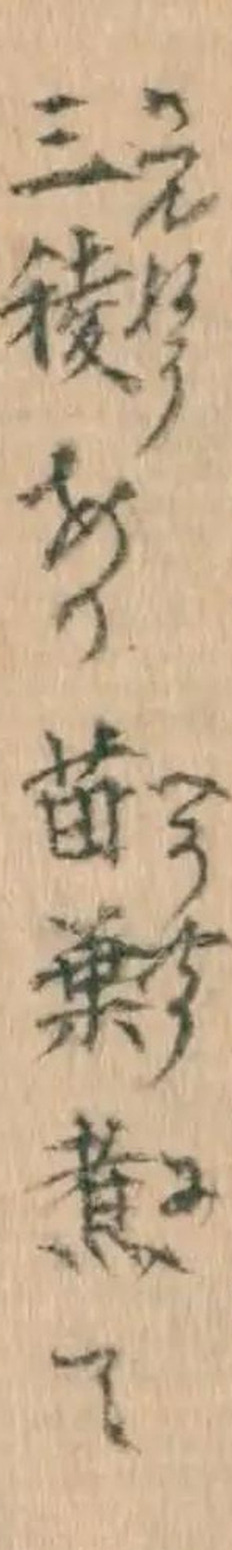三稜あり苗葉煮て
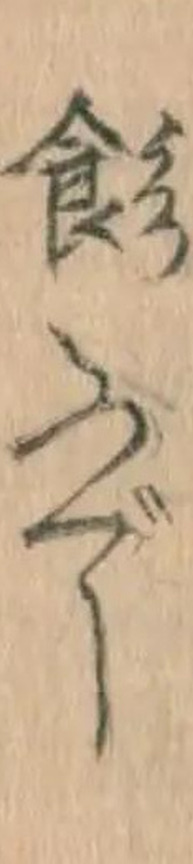食ふべし

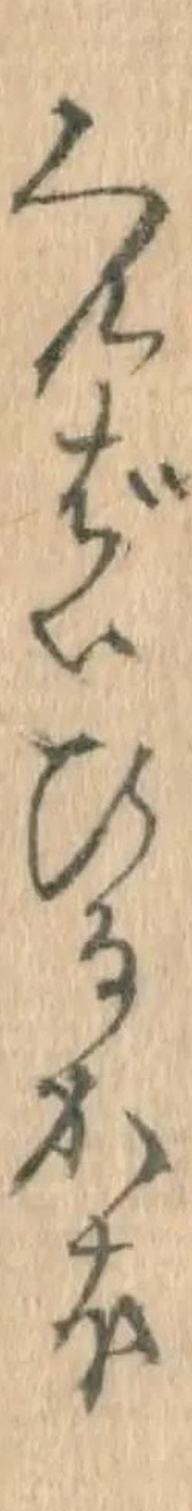くんばいひるかほ
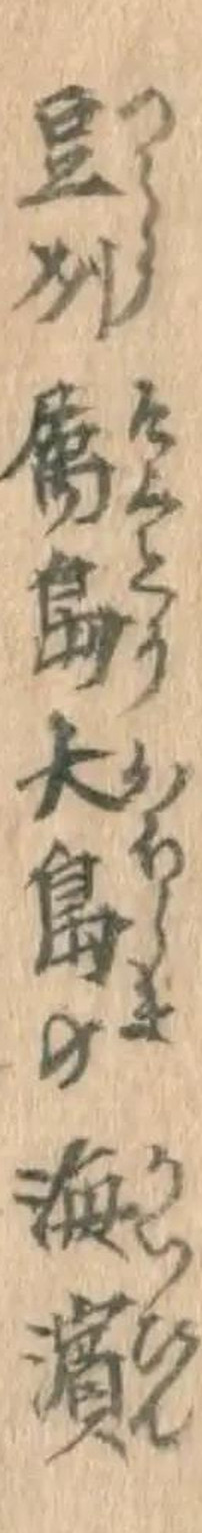豆州属島大島の海浜
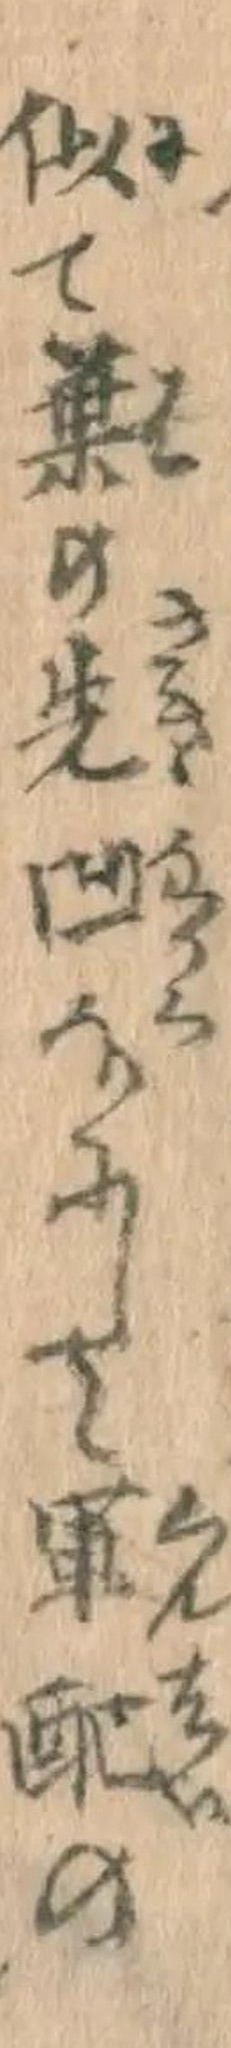似て葉の先凹ほにして軍配の
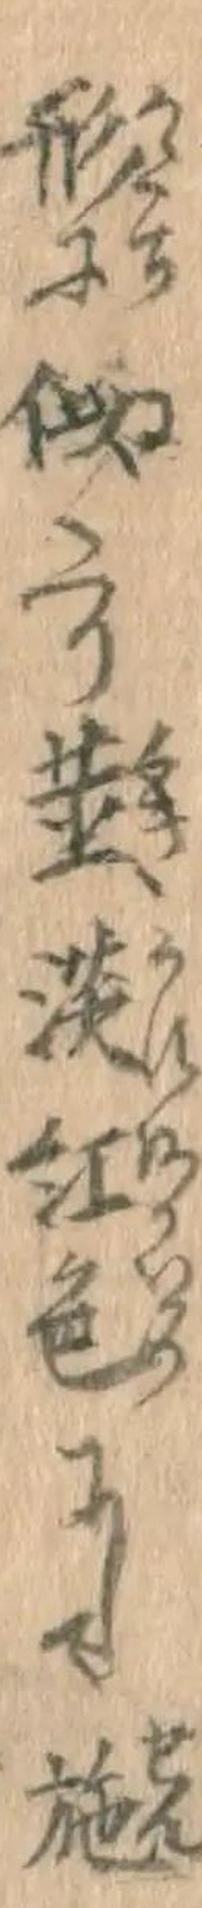形に似たり茎淡紅色にして施
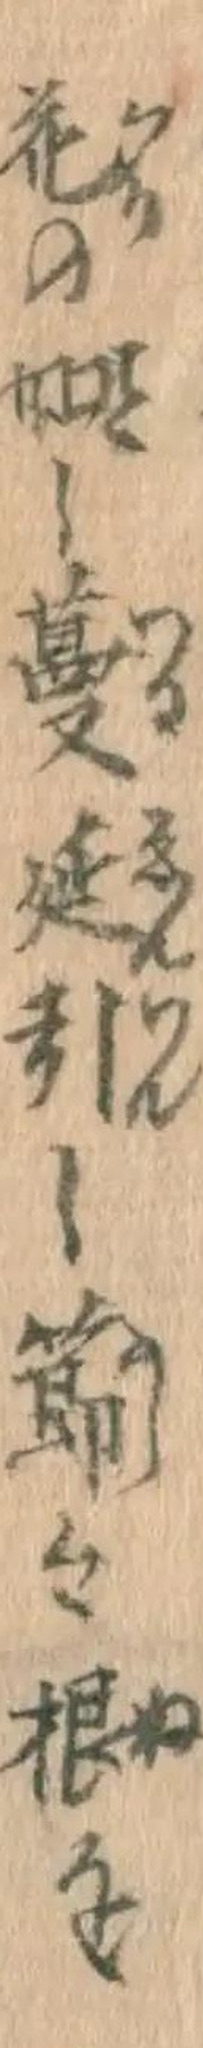花の如し蔓延引し節々根を
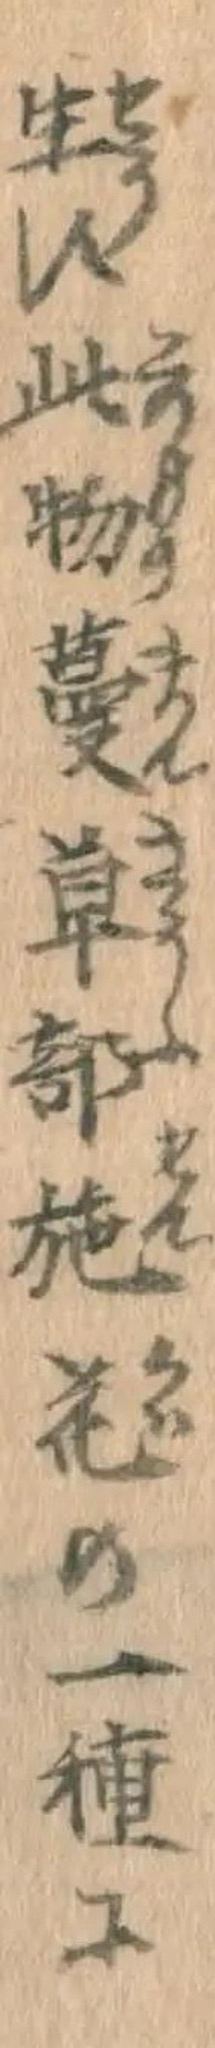生す此物蔓草部施花の一種に
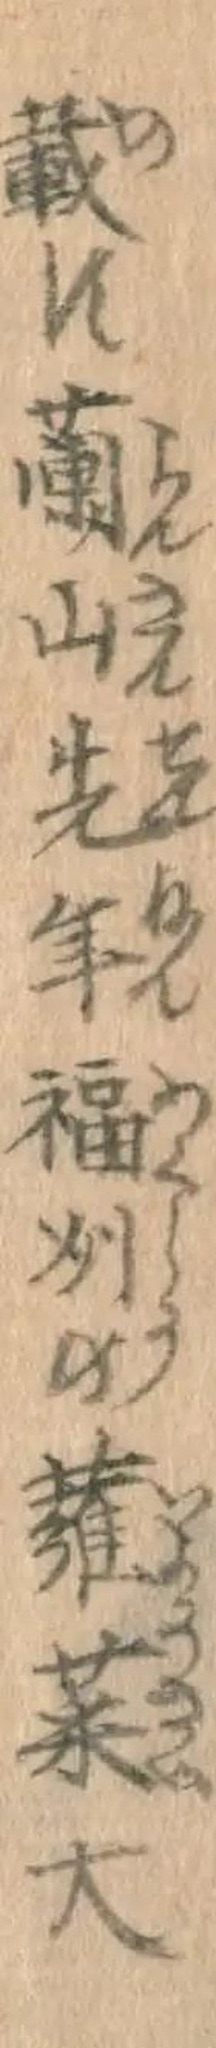載す蘭山先年福州の蕹菜大
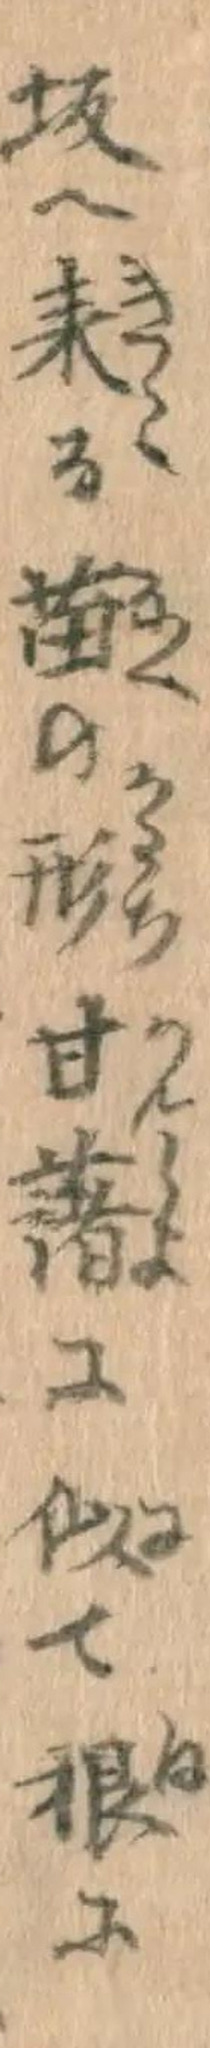坂へ来る苗の形甘藷に似て根に
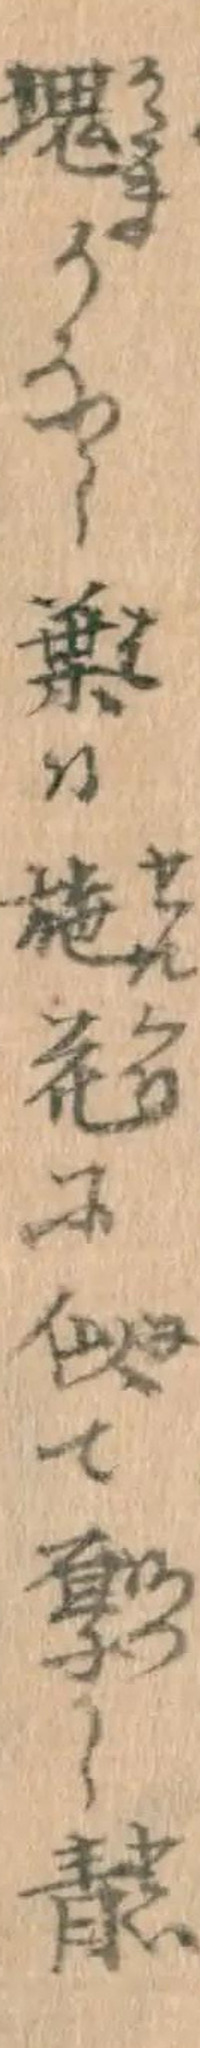塊りなし葉は施花に似て厚し青
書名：本草図譜. 巻46-48
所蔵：国立国会図書館 National Diet Library, JAPAN
